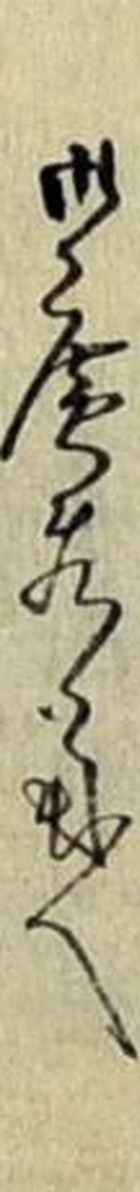御広敷御用人
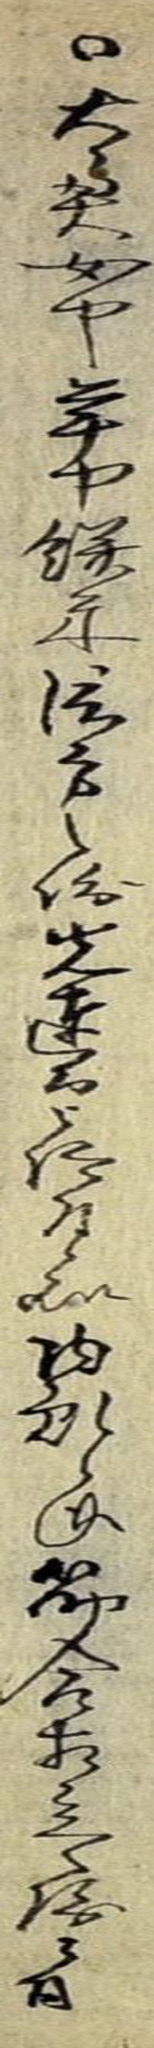○大奥女中年中餅米渡方之儀先達而被仰付候処内願之趣筋合相立候儀に付
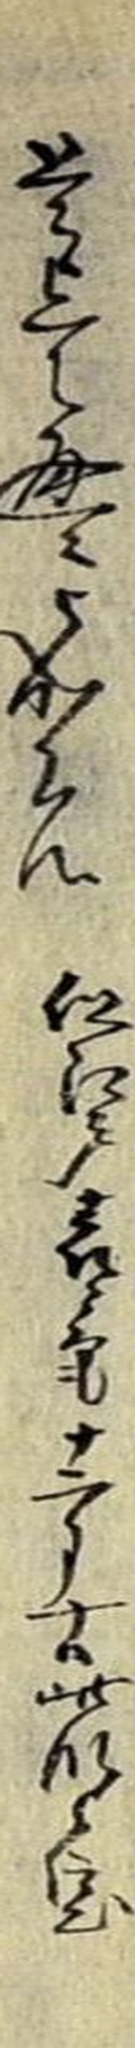是迄之通に被成下候但江戸表に而も十二月十日此段被仰出
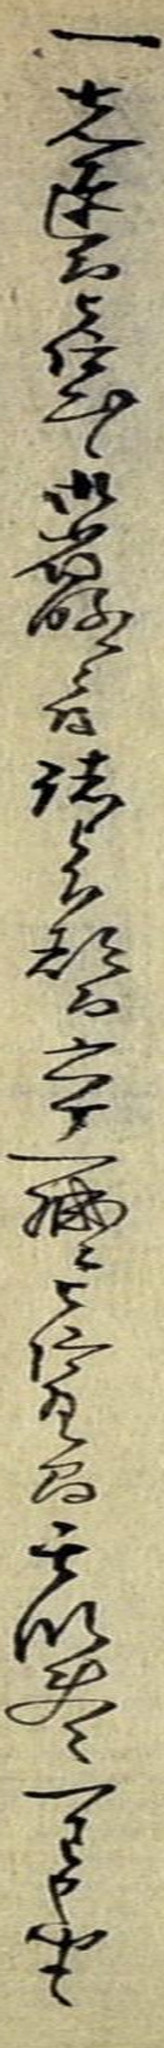一先達而被仰出候御省略に付諸被下都而六ヶ一減に被仰付候間其段夫々可被申聞候
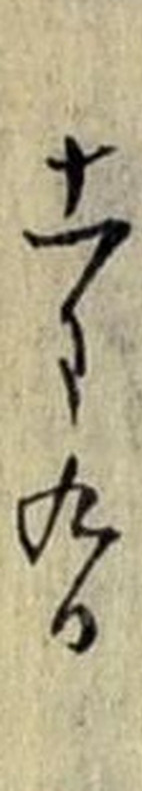十一月九日
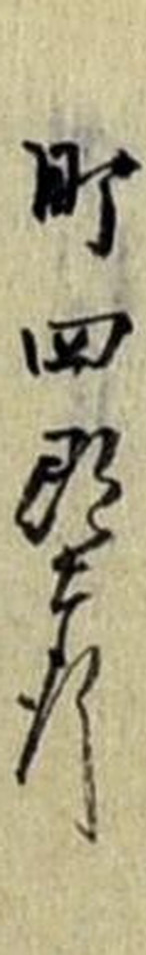町四郡奉行
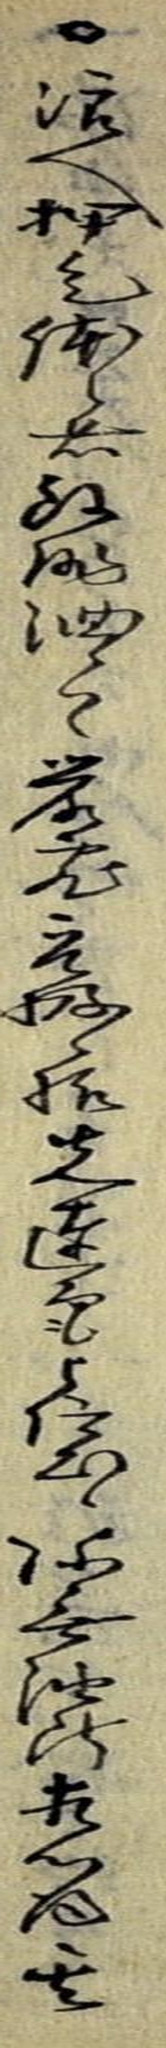○浪人押乞体之者致徘徊候はヽ厳敷取扱候様先達而も被仰出候弥無由断相心得其
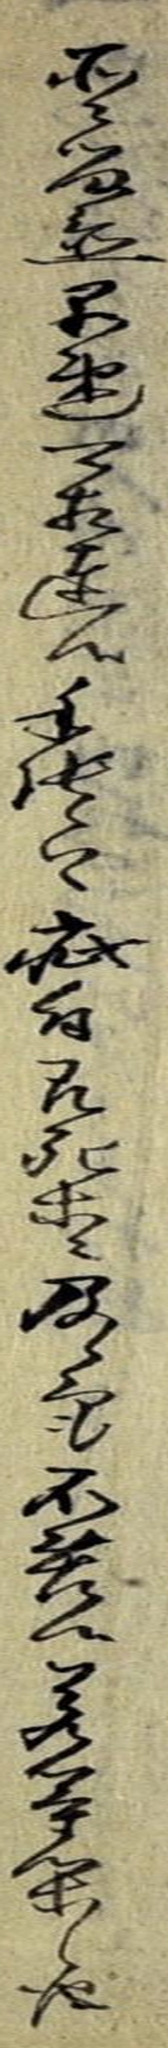所に留置早速可相達候手張候はヽ疵付即死等に及候而も不苦候若等閑之儀
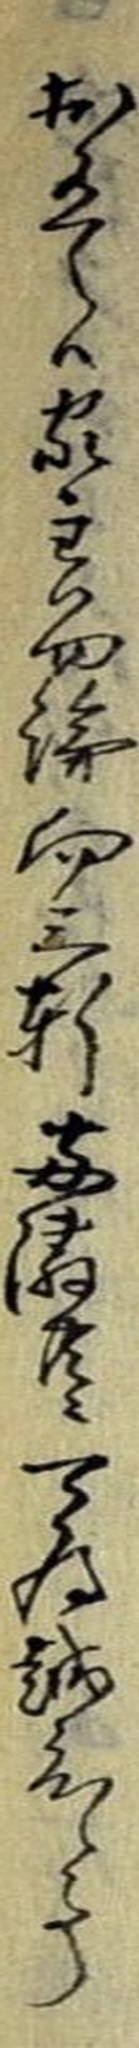於有之は家主は勿論向三軒両隣共に可為越度候事
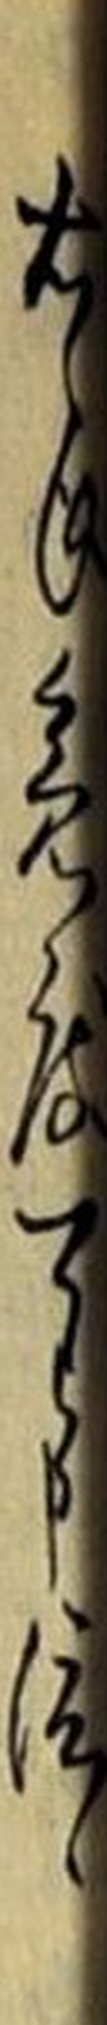右之趣急度可被申渡候
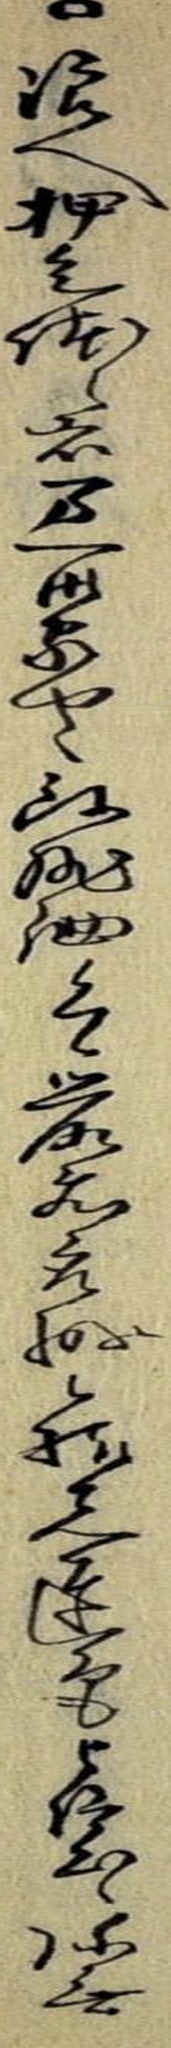○浪人押乞体之者万一御家中へ致徘徊候はヽ厳敷取扱候様先達而も被仰出候弥無
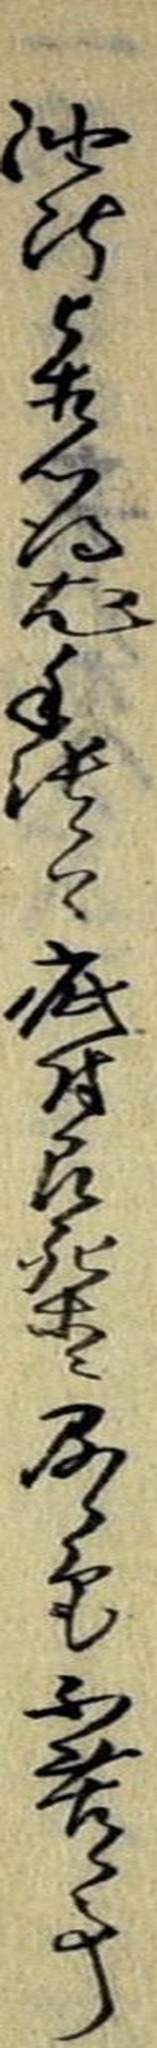由断被相心得尤手張候はヽ疵付即死等に及候而も不苦候事
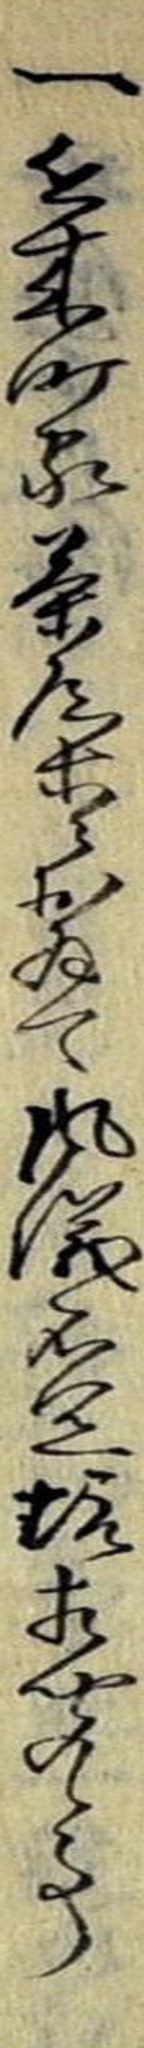一近来町家茶屋等におゐて風儀不宜趣相聞候事
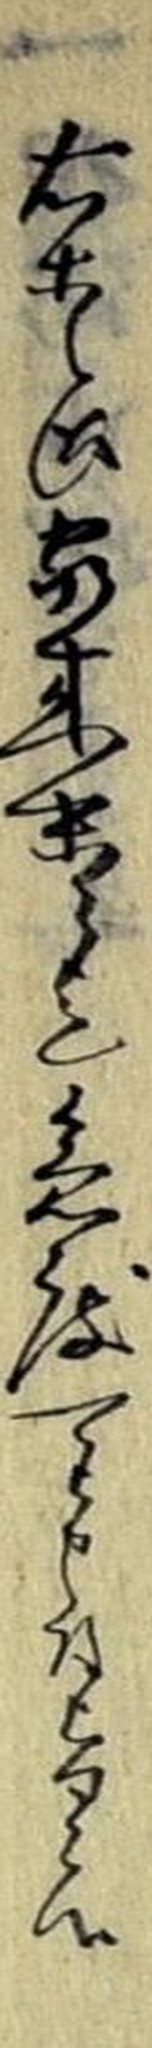右等之趣家来末々迄急度可被申付旨に候
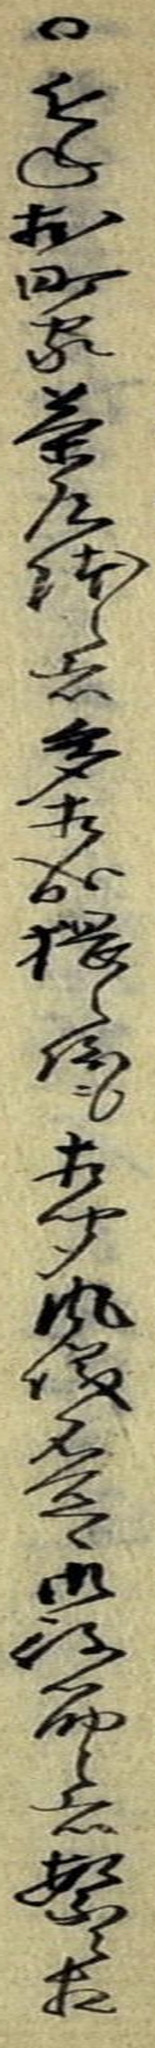○近年於町家茶屋体之者多相成猥之儀も相聞風儀不宜候御役筋之者繁々相
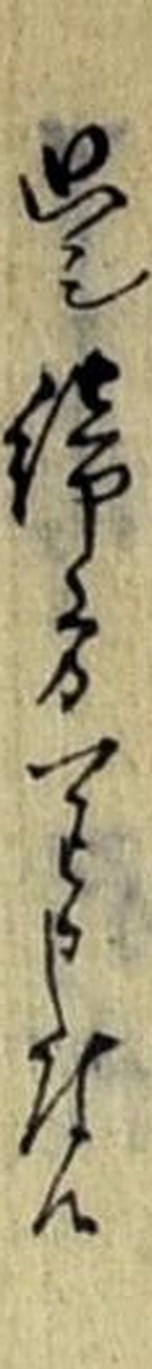廻し締り方可被申付候
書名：命令之部 四
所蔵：福井県文書館 Fukui Prefectural Archives
